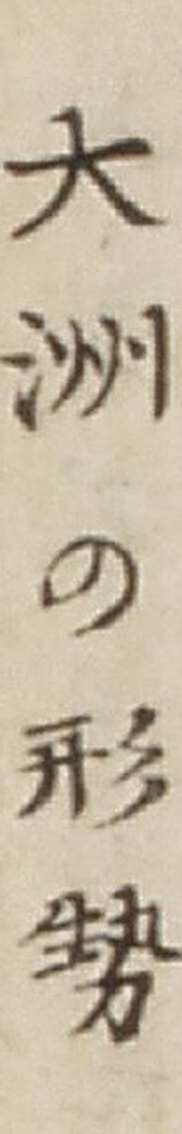大洲の形勢
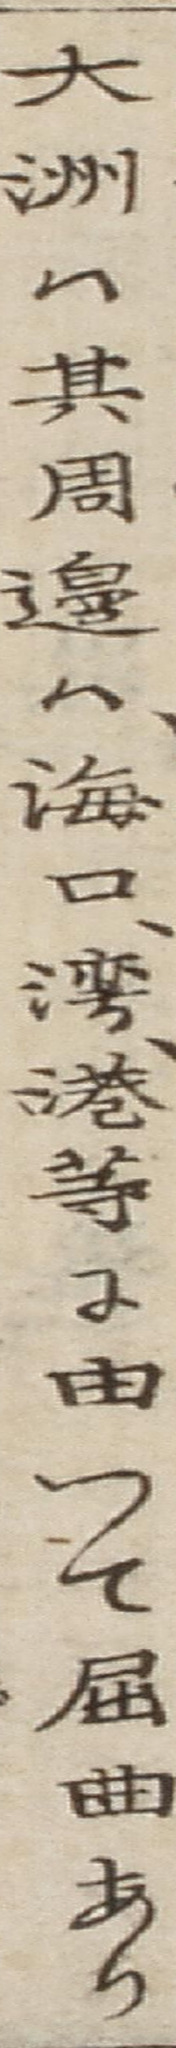大洲は其周辺は、海口、湾、港等に由つて屈曲あり
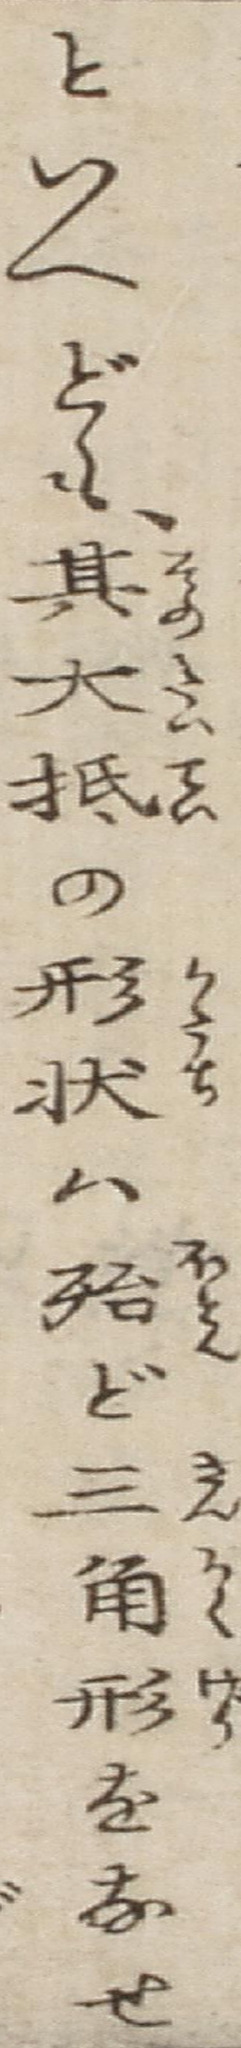といへども、其大抵の形状は殆ど三角形をなせ
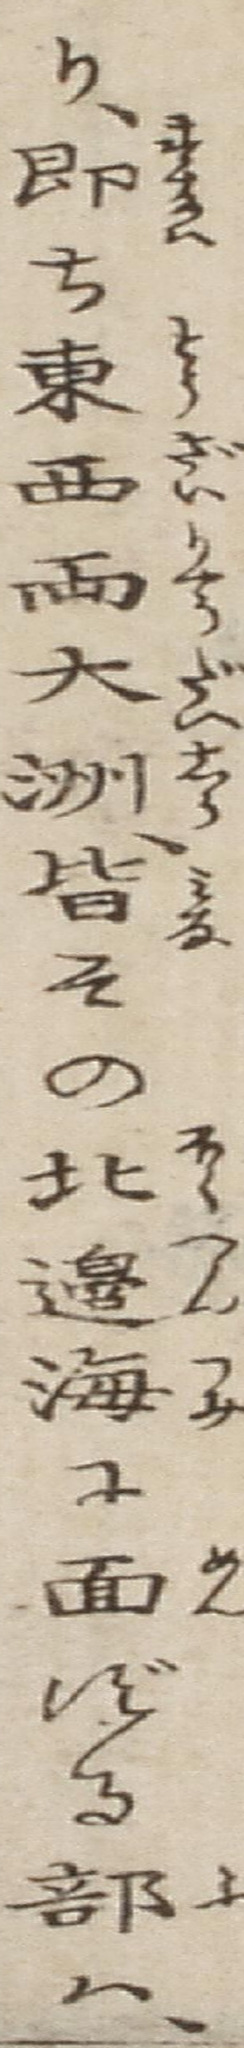り、即ち東西両大洲、皆その北辺海に面ずる部は、
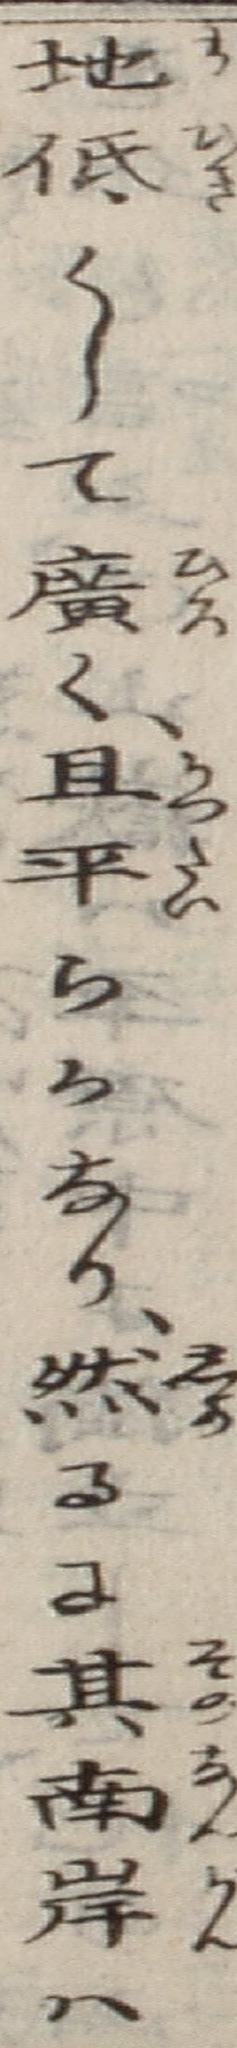地低くして廣く、且平らかなり、然るに其南岸は
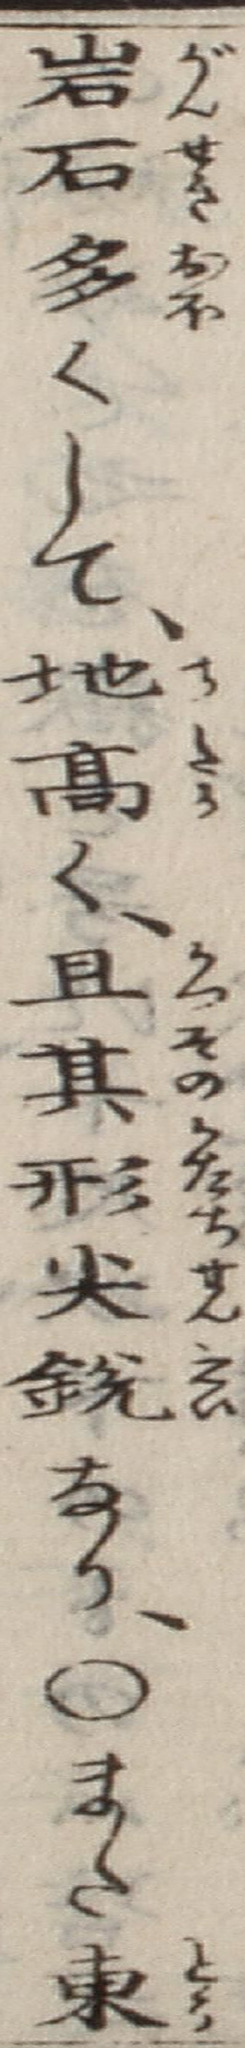岩石多くして、地高く、且其形尖鋭なり、〇また東
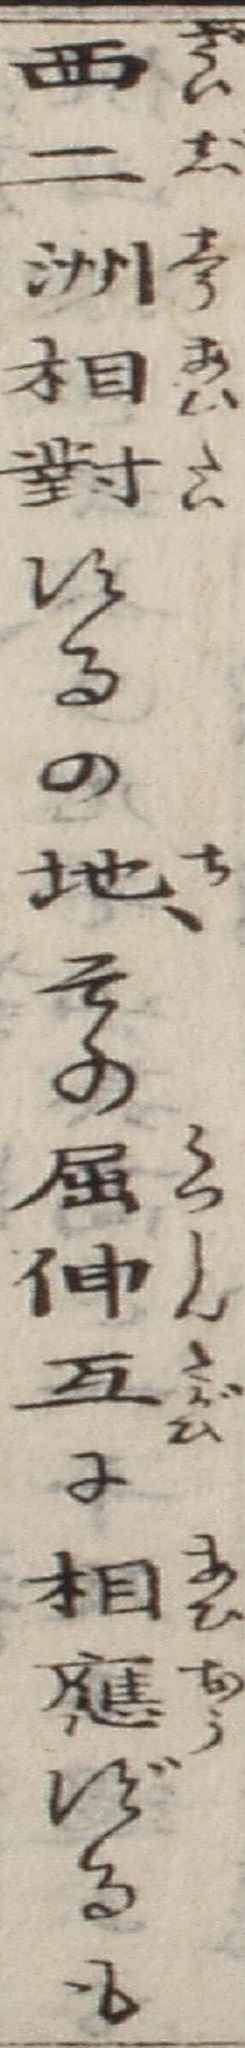西二洲相対するの地、その屈伸互に相応ずるも
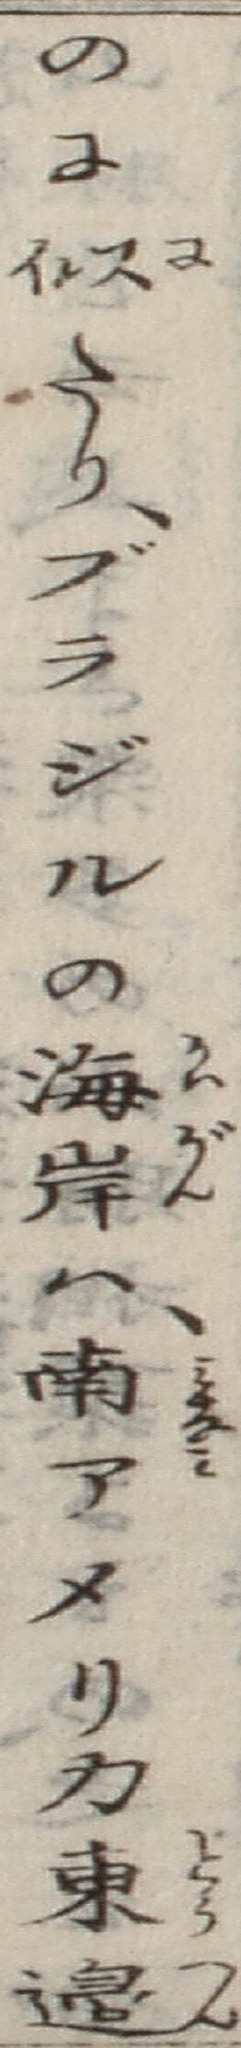のに似たり、ブラジルの海岸は、南アメリカ東辺
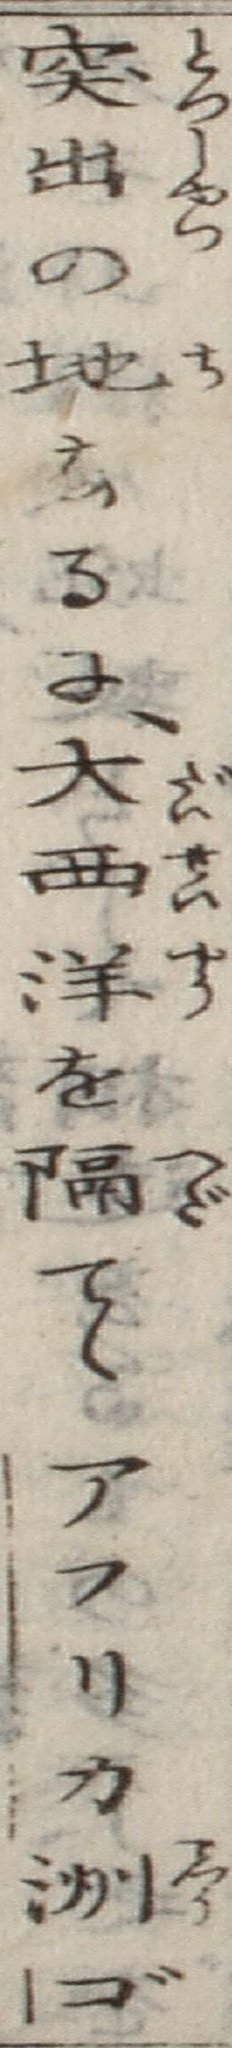突出の地なるに大西洋を隔ててアフリカ洲ゴ
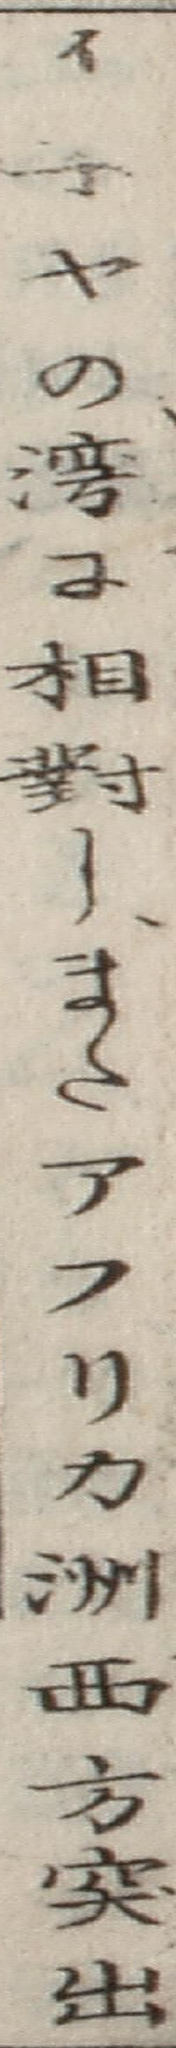ィチヤの湾に相対し、またアフリカ洲西方突出
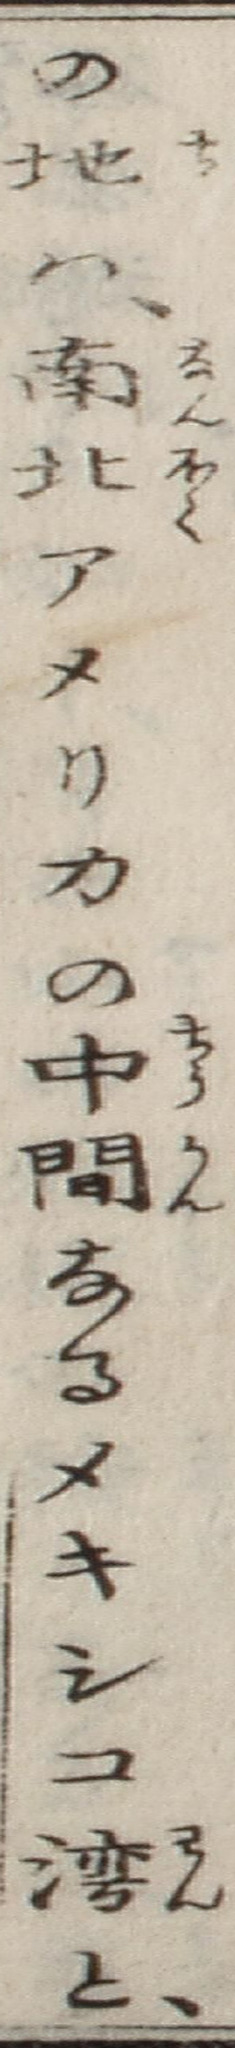の地は、南北アメリカの中間なるメキシコ湾と、
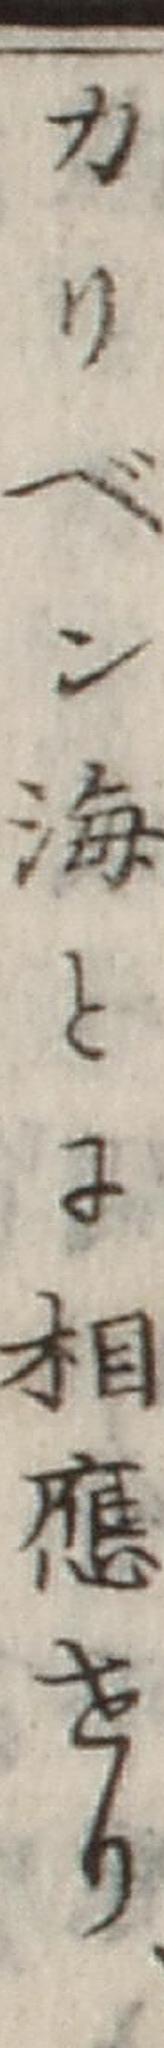カリベン海とに相応せり、
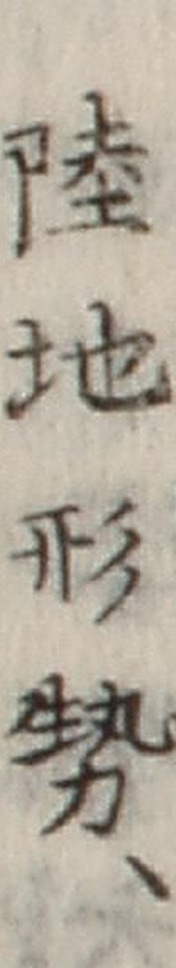陸地形勢、

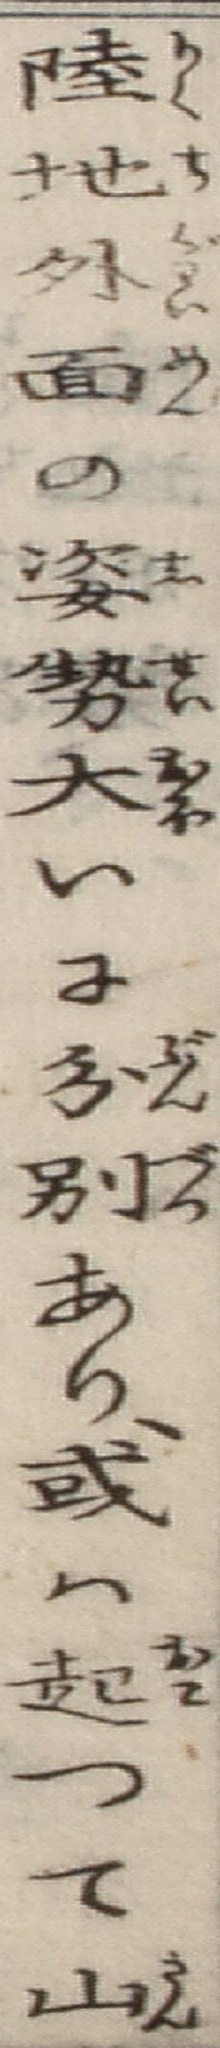陸地外面の姿勢大いに分別あり、或は起つて山
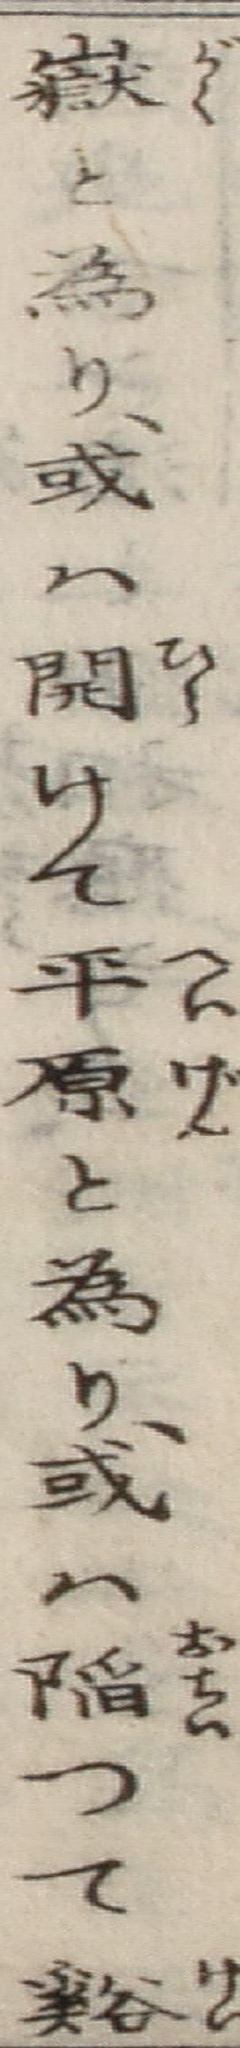嶽と為り、或は開けて平原と為り、或は陥つて谿
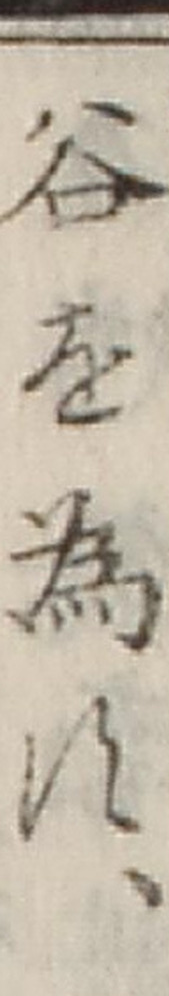谷を為す、
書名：訓蒙　天然地理學　上
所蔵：東京大学地震研究所図書室 Earthquake Research Institute Library, The University of Tokyo, JAPAN
